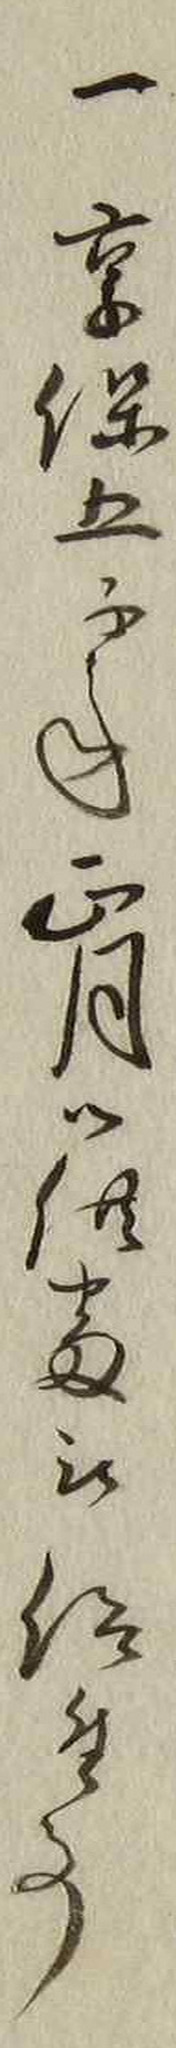一享保五子年正月御供番被仰付候事
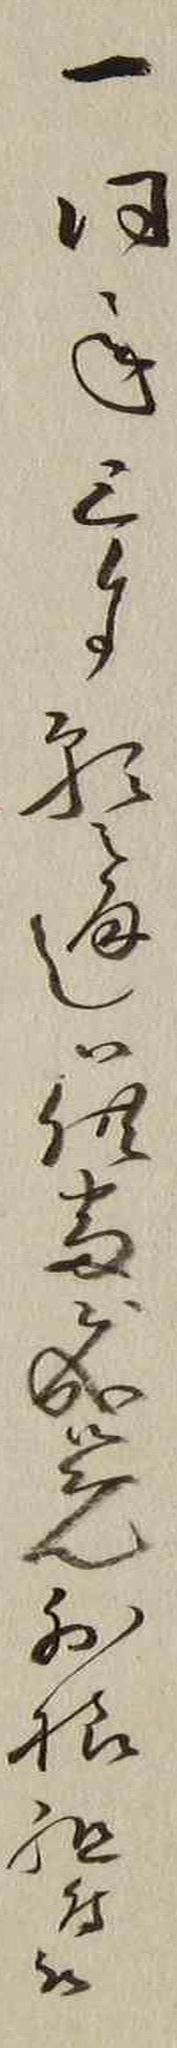一同年三月願之通御供番被成御免外様組付被
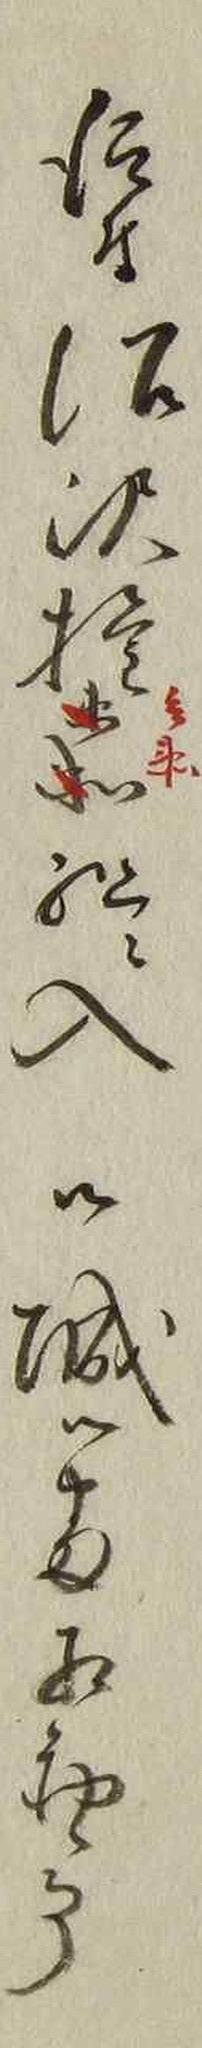仰付沼沢権衛衛組に入御城御番相勤候事
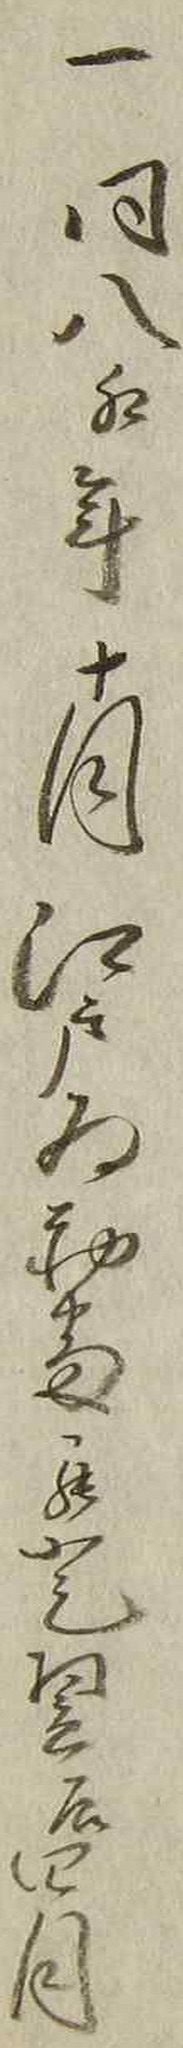一同八卯年十月江戸為勤番罷登翌辰四月
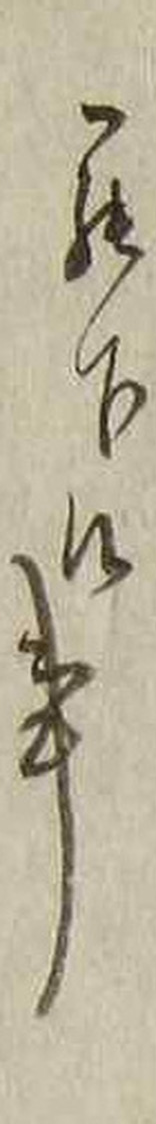罷下候事

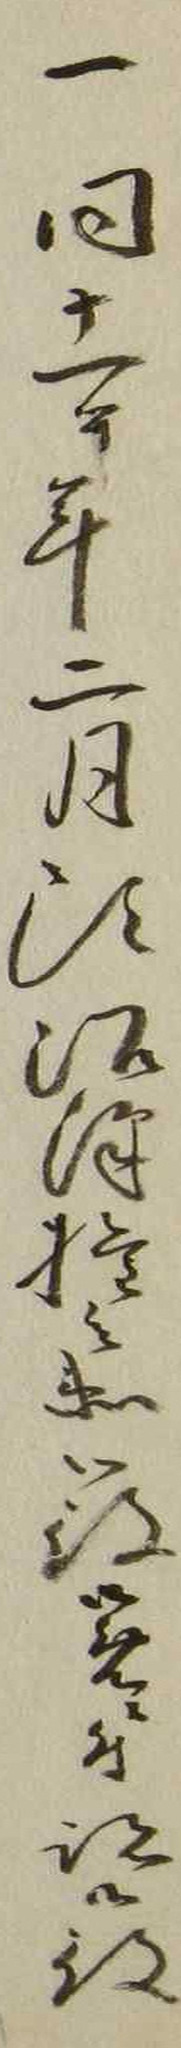一同十一午年二月頭沼沢権兵衛御役御免に付跡御役
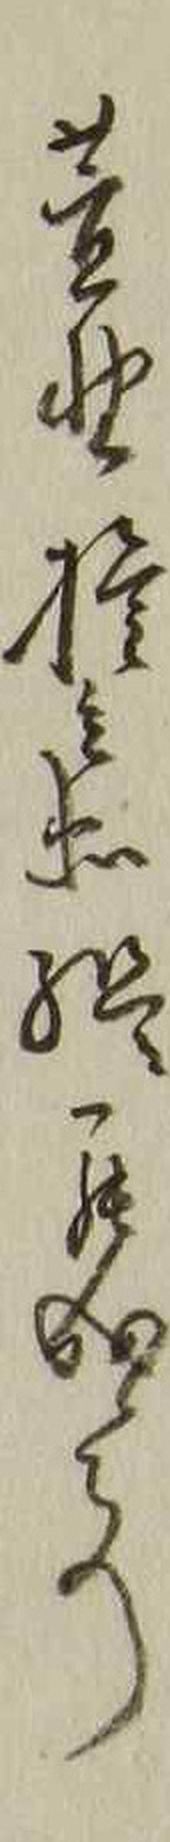菅野権兵衛組に罷成候事
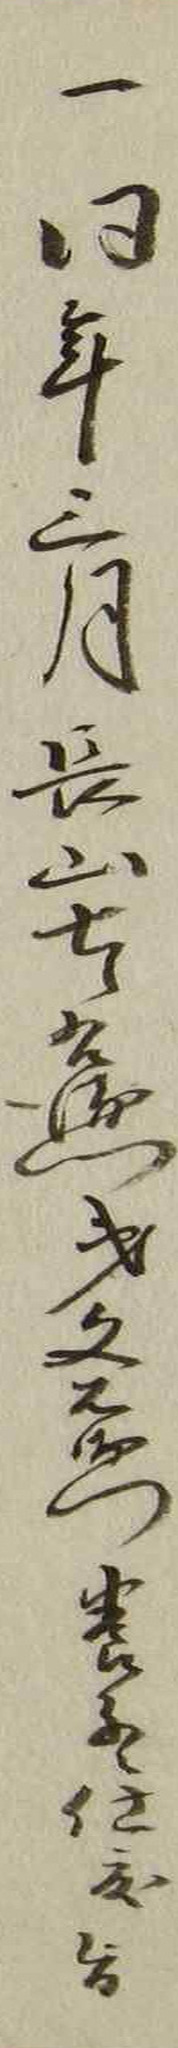一同年三月長山七郎右衛門弟久右衛門養子仕度旨
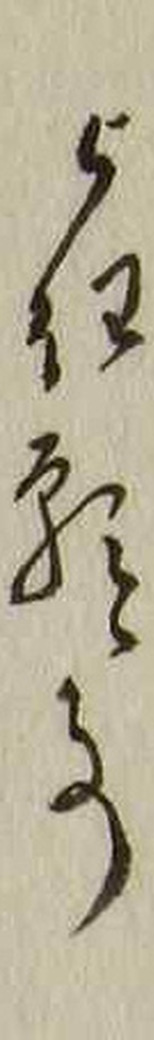被任願候事
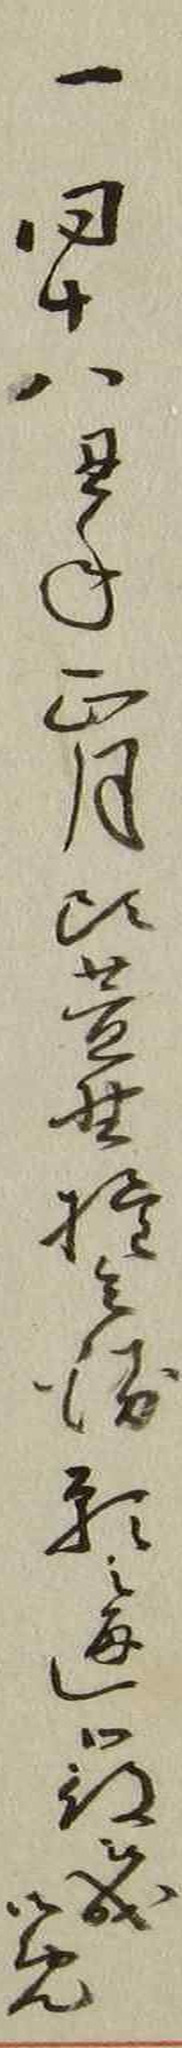一同十八丑年正月頭萱野権兵衛願之通御役被成御免
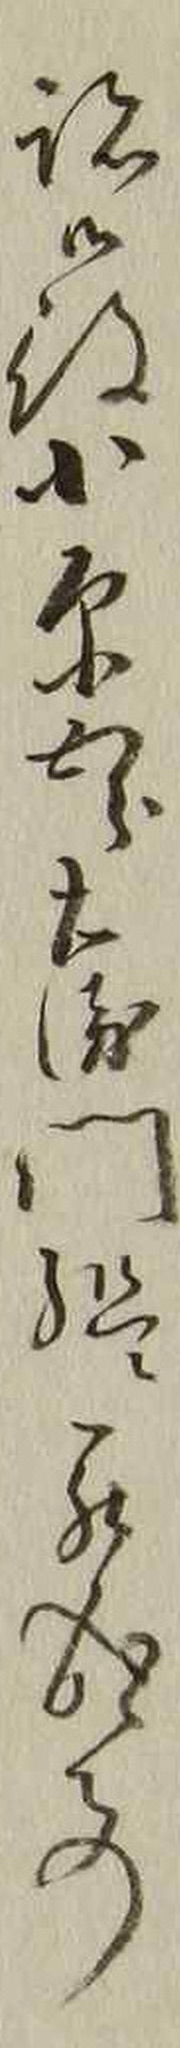跡御役小原五郎右衛門組に罷成候事
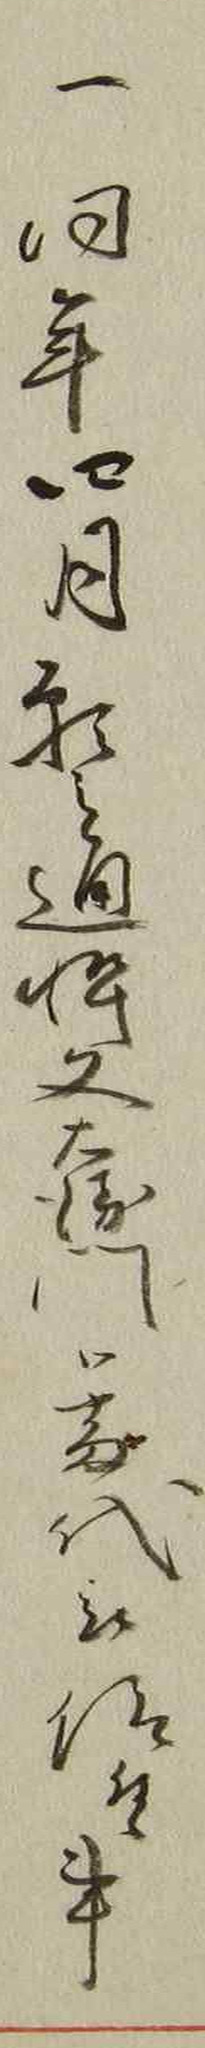一同年四月願之通忰又右衛門御番代被仰付候事
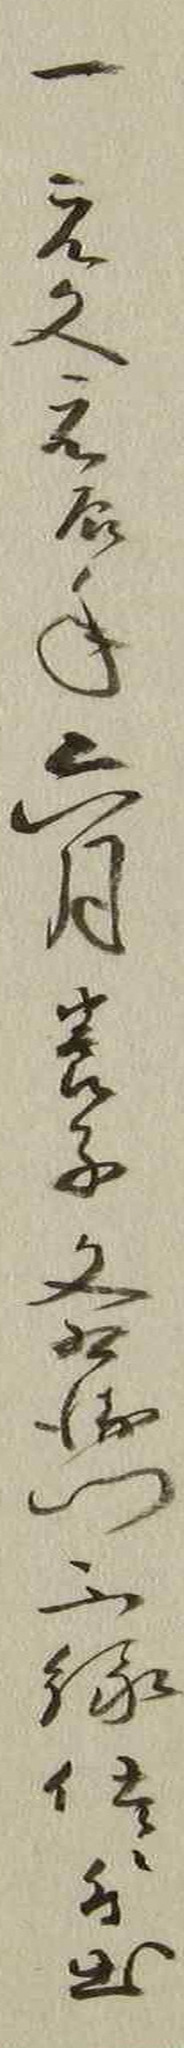一元文元辰年六月養子文右衛門不縁仕候に付出
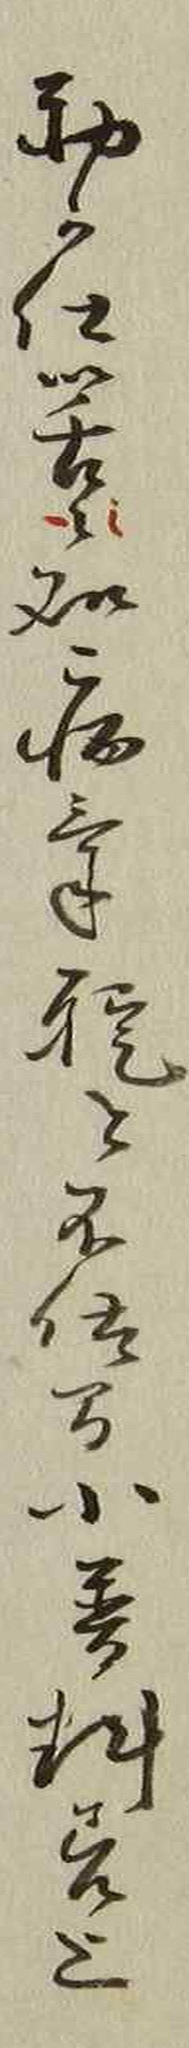勤可仕筈処病気願を不仕候間小普料差上
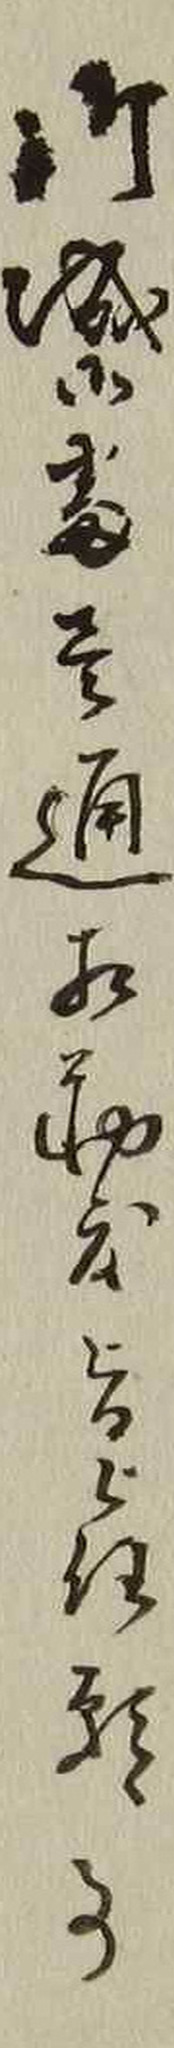御城御番壱通相勤度旨被任願候事
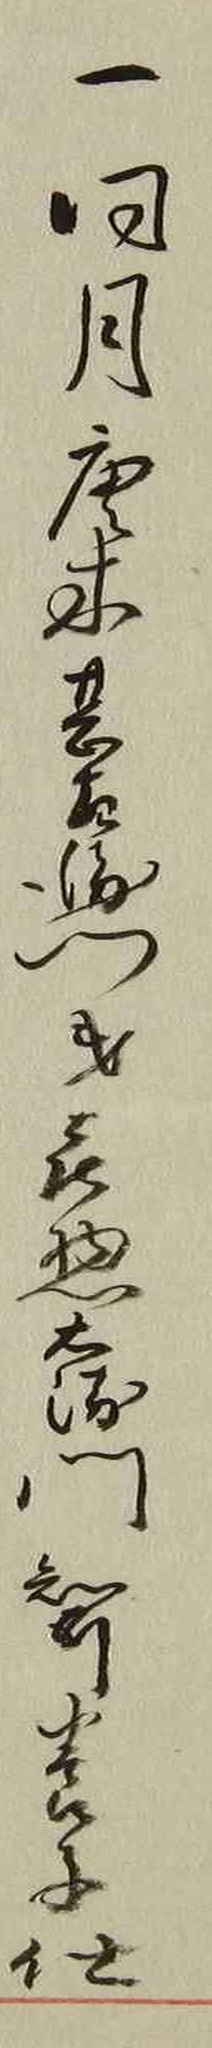一同月唐木甚左衛門弟喜惣右衛門婿養子仕
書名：諸士系譜　巻之6　い之部6
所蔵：会津若松市立会津図書館
